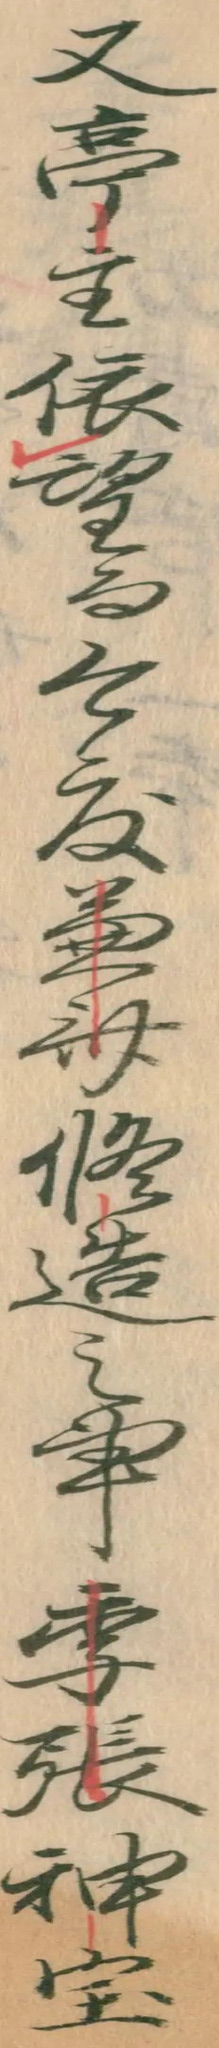又亭-主依望而今度兼斎修-造之事季張神-宝
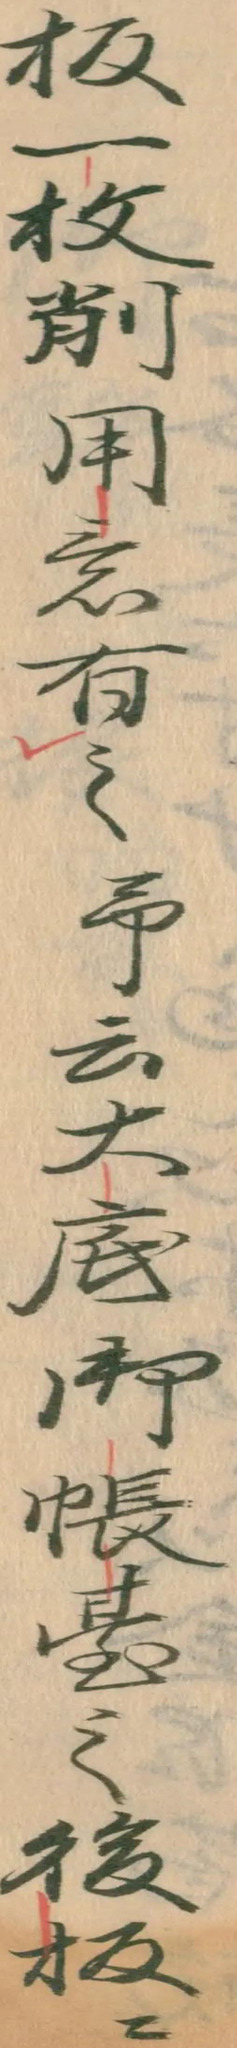板一-枚削用-意有之予云大-底御-帳-台之後_板ニ
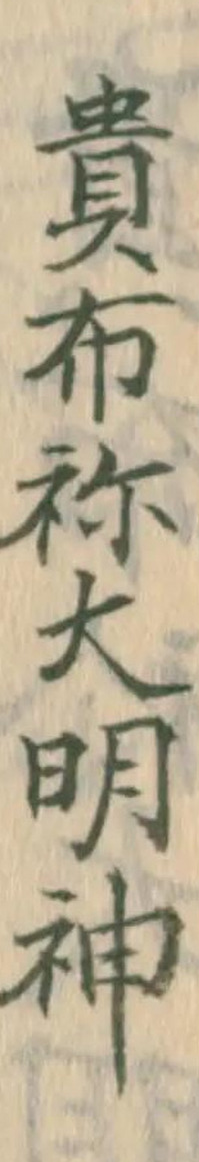貴布祢大明神
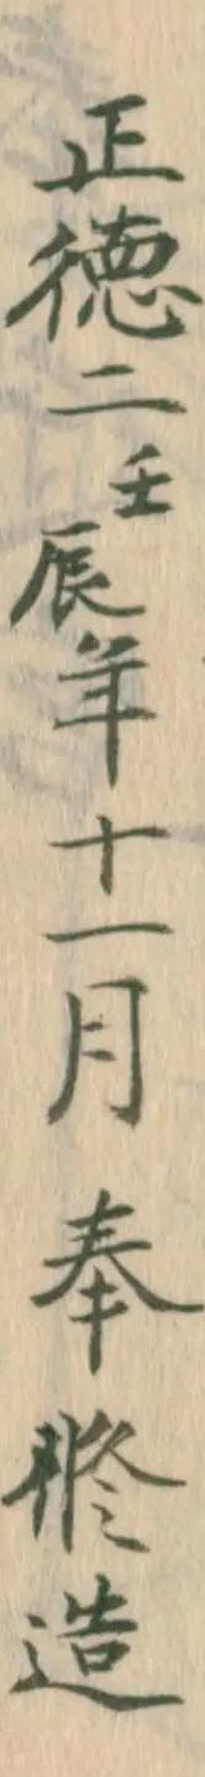正徳二壬辰年十一月奉修造
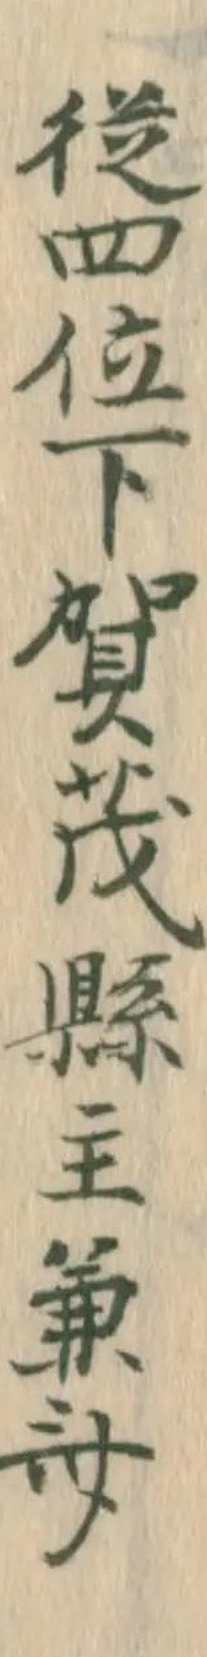従四位下賀茂県主兼斎
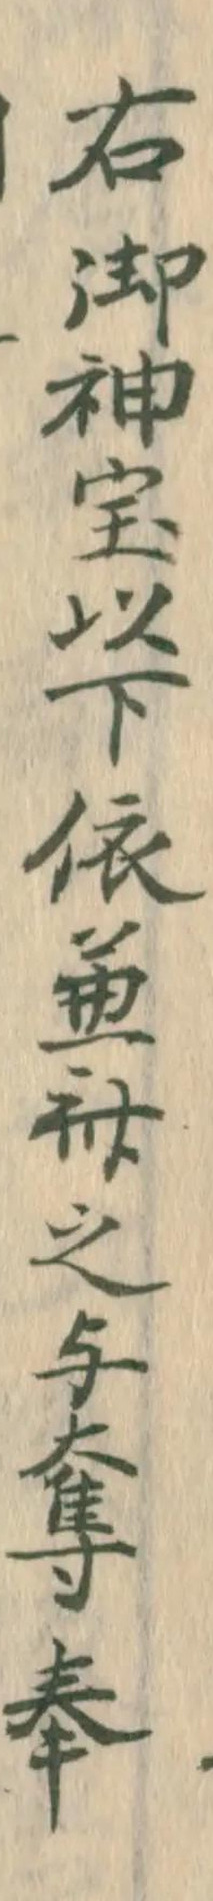右御神宝以下依兼斎之与奪奉
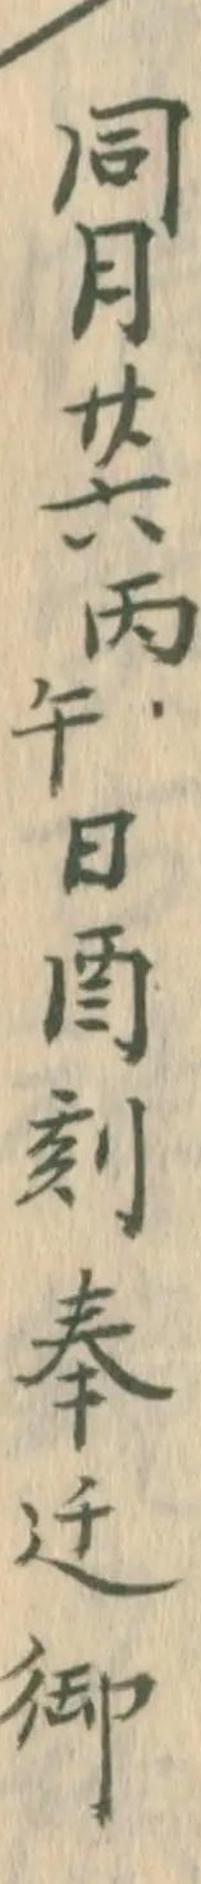同月廿六丙午日酉刻奉迁御
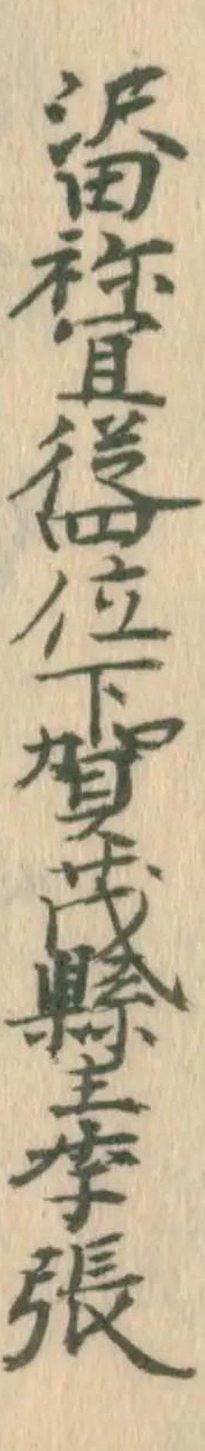沢田祢宜従四位下賀茂県王李張
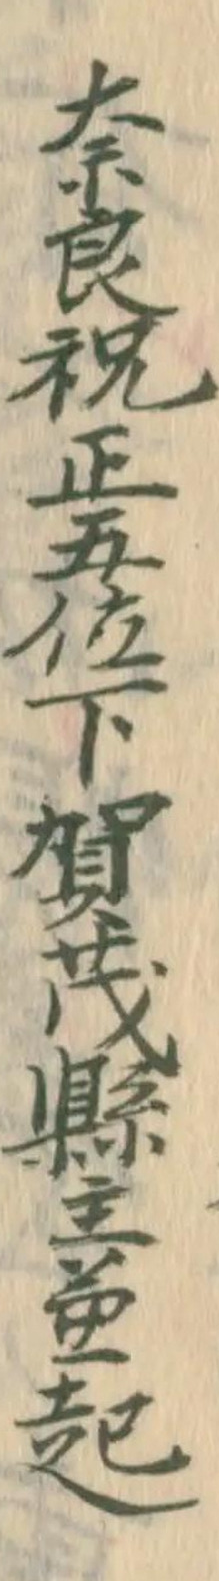奈良祝正五位下賀茂県主兼起

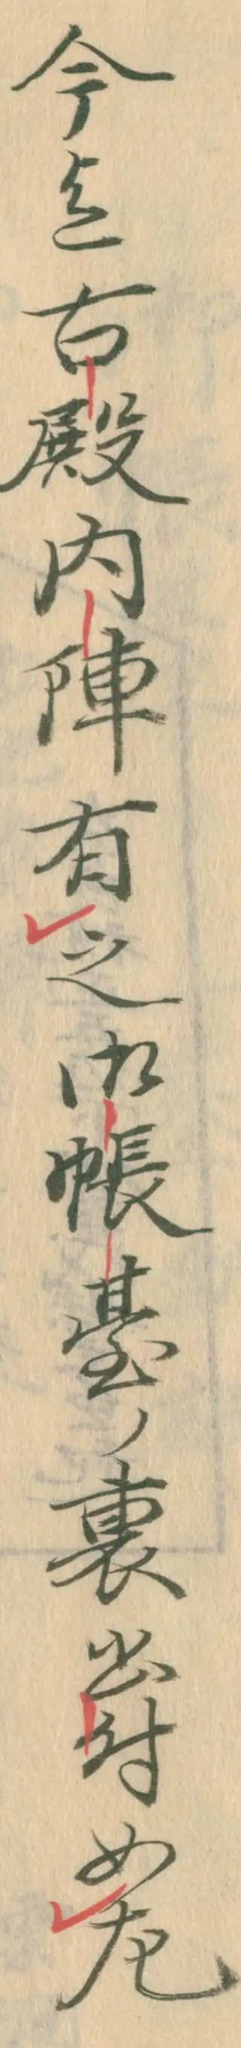今迄古-殿内-陣有之御-帳-台ノ裏書-付如左
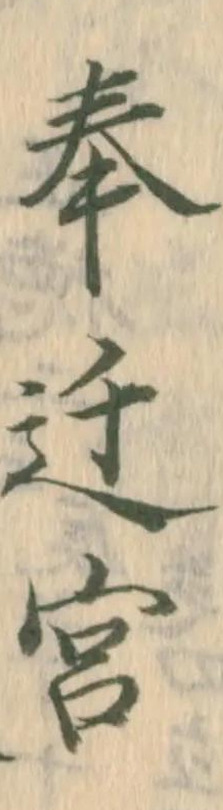奉迁宮
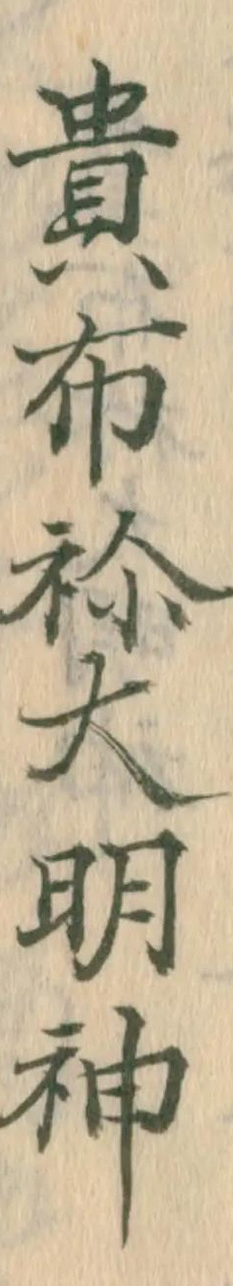貴布祢大明神
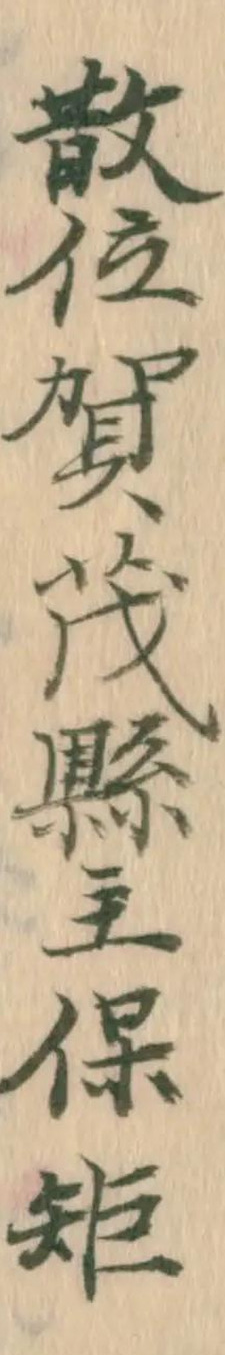散位賀茂県主保矩
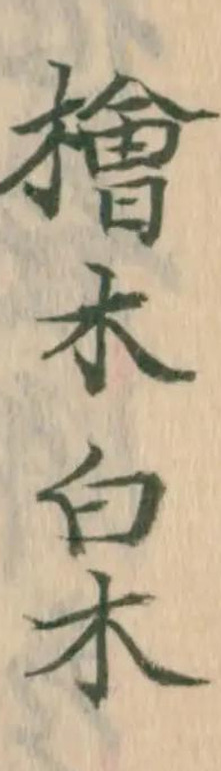桧木白木
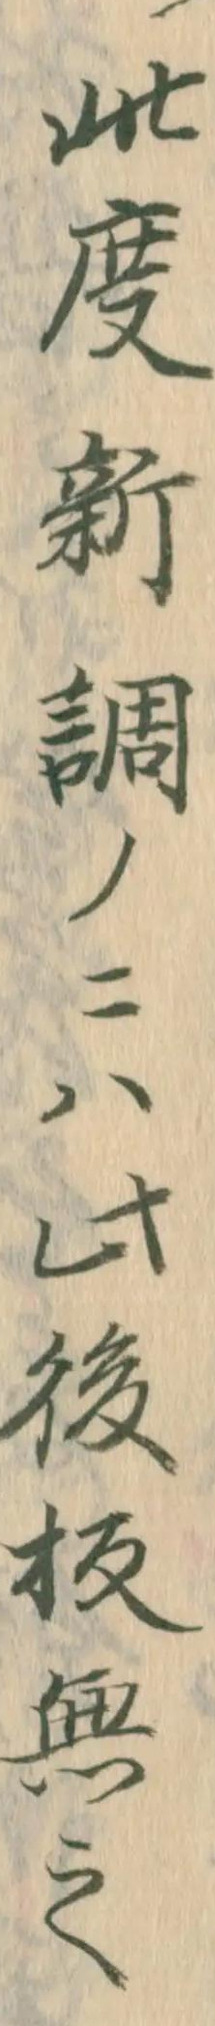此度新調ノニハ此後板無之
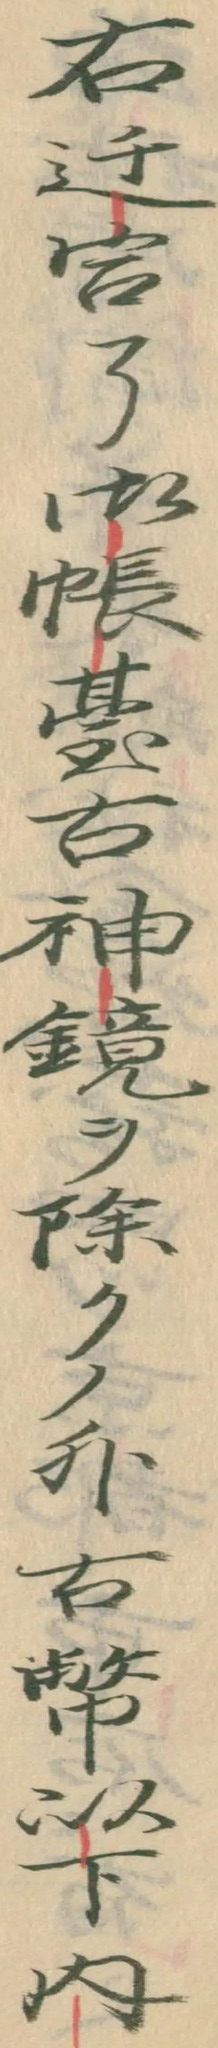右迁-宮了御-帳-台古神-鏡ヲ除クノ外古幣以-下内-
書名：賀茂社記録. 第16冊
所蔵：国立国会図書館 National Diet Library, JAPAN
